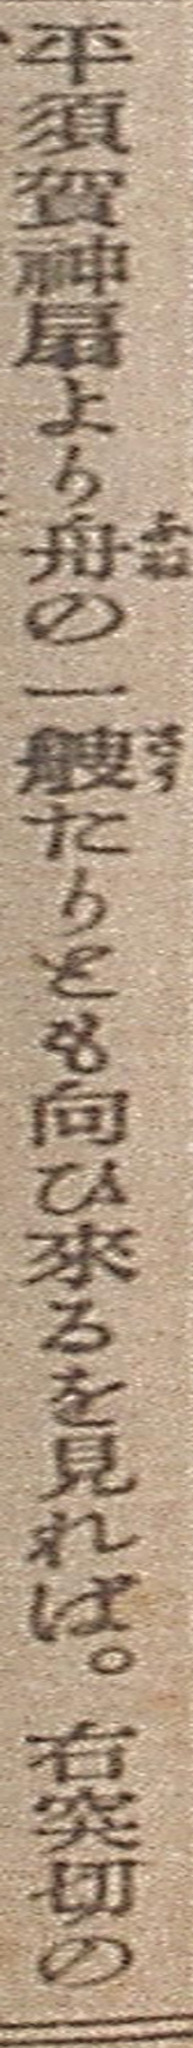平須賀神扇より舟の一艘たりとも向ひ来るを見れば。右突切の
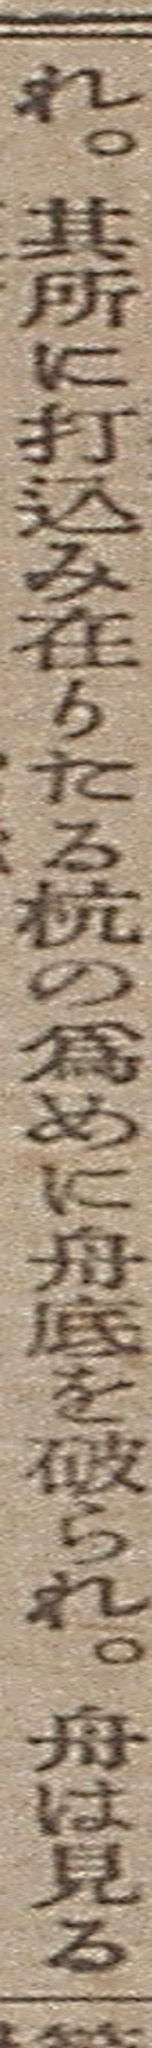れ。其所に打込み在りたる杭の為めに舟底を破られ。舟は見る
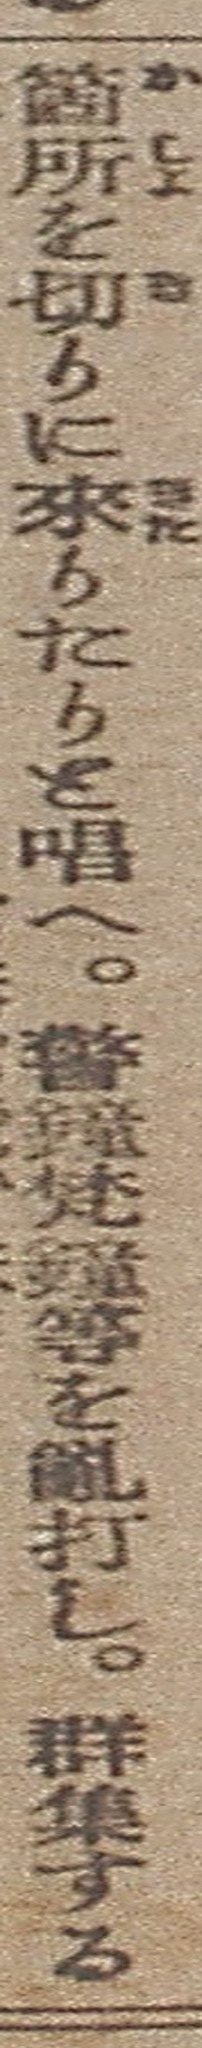箇所を切りに来りたりと唱へ。警鐘梵鐘等を乱打し。群集する
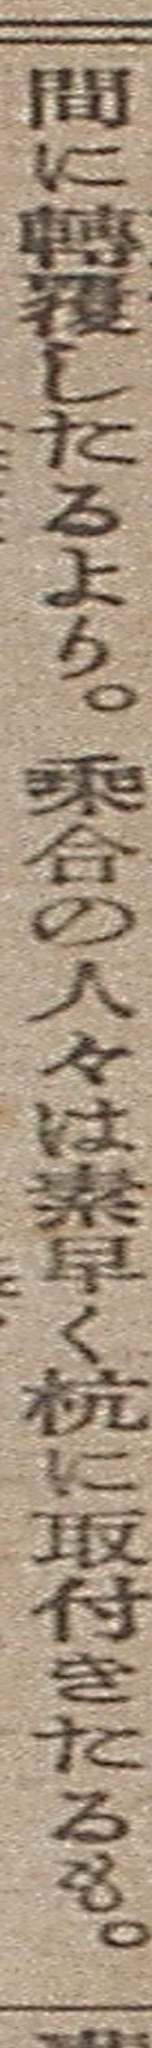間に転覆したるより。乗合の人々は素早く杭に取付きたるも。
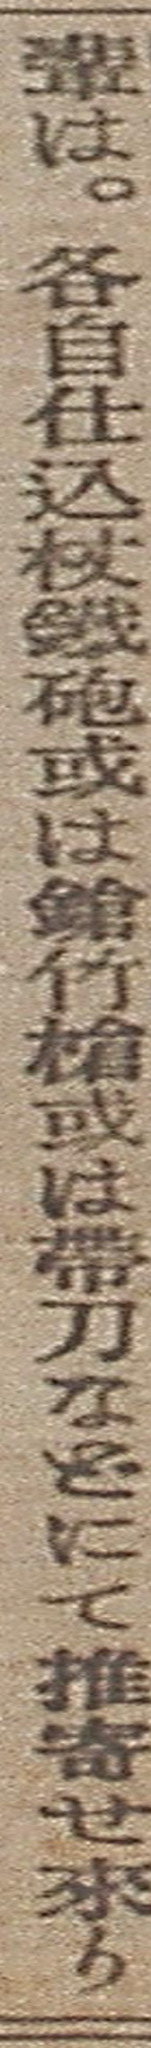輩は。各自仕込杖鉄砲或は鎗竹槍或は帯刀などにて推寄せ来り
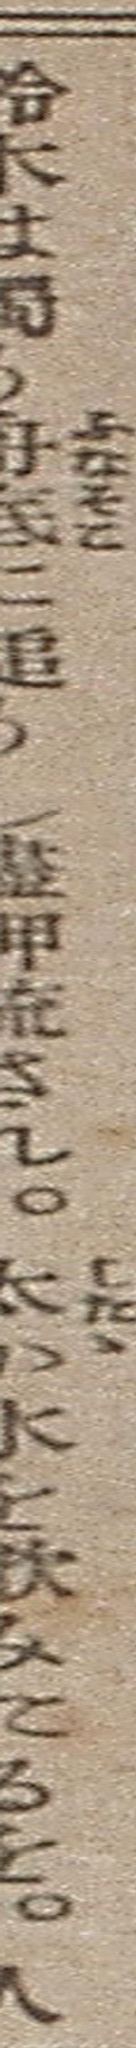鈴木は独り舟底に縋りし侭押流され。太か水を飲みたるを。人
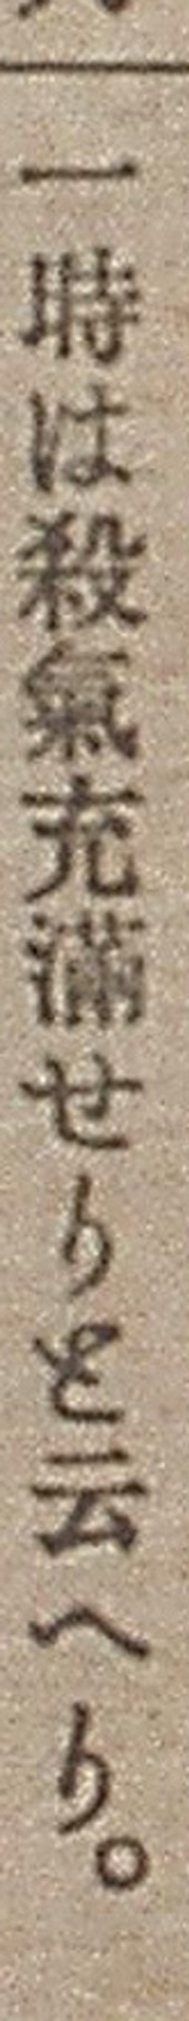一時は殺気充満せりと云へり。
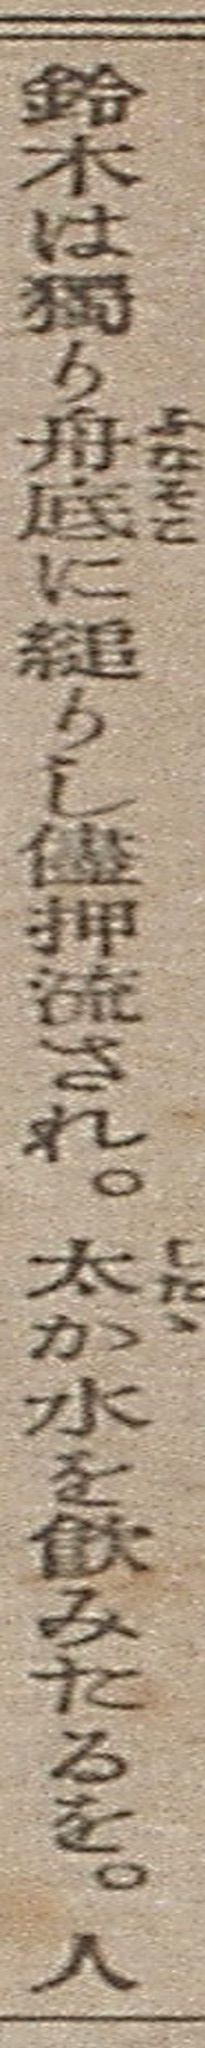鈴木は独り舟底に縋りし侭押流され。太か水を飲みたるを。人
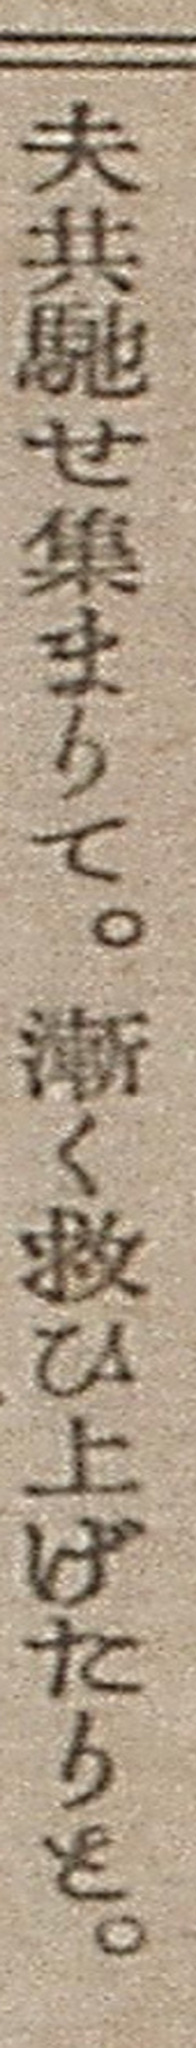夫共馳せ集まりて。漸く救ひ上げたりと。
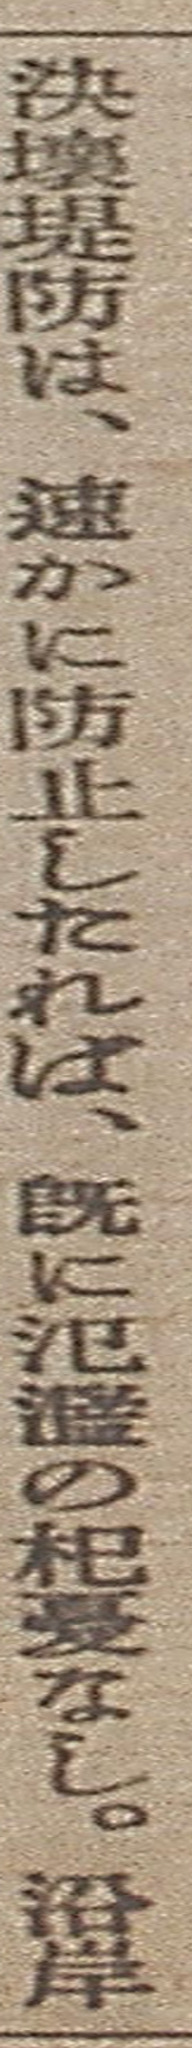決壊堤防は、速かに防止したれば、既に氾濫の杞憂なし。沿岸の
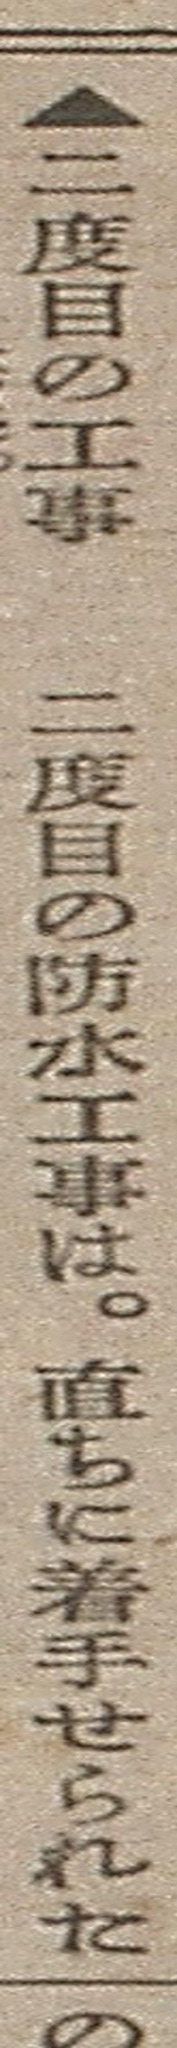▲二度目の工事二度目の防水工事は。直ちに着手せられた
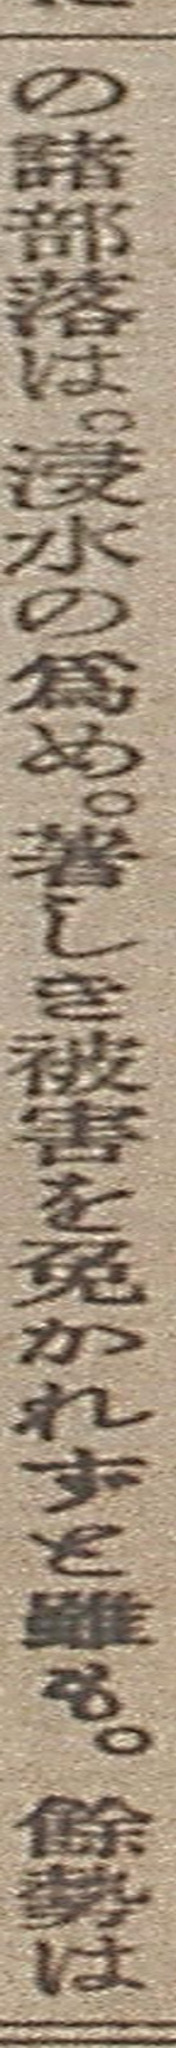諸部落は。浸水の為め。著しき被害を免かれずと雖も。余勢は
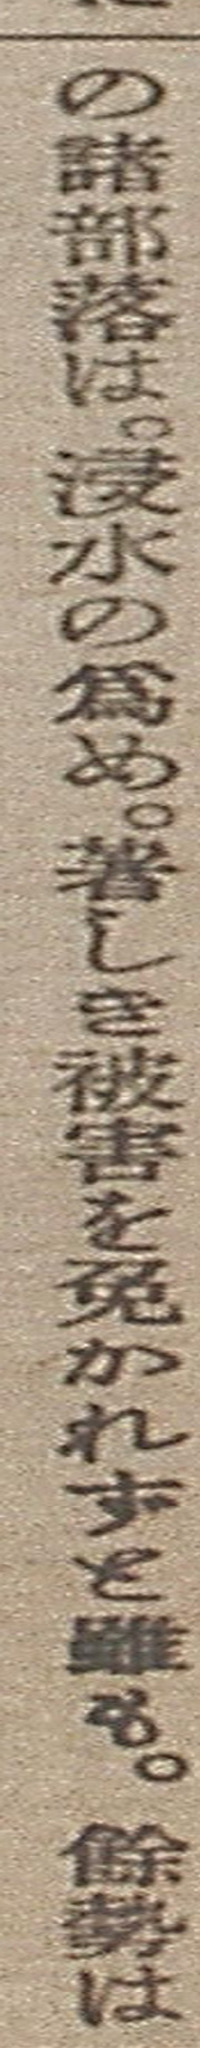諸部落は。浸水の為め。著しき被害を免かれずと雖も。余勢は
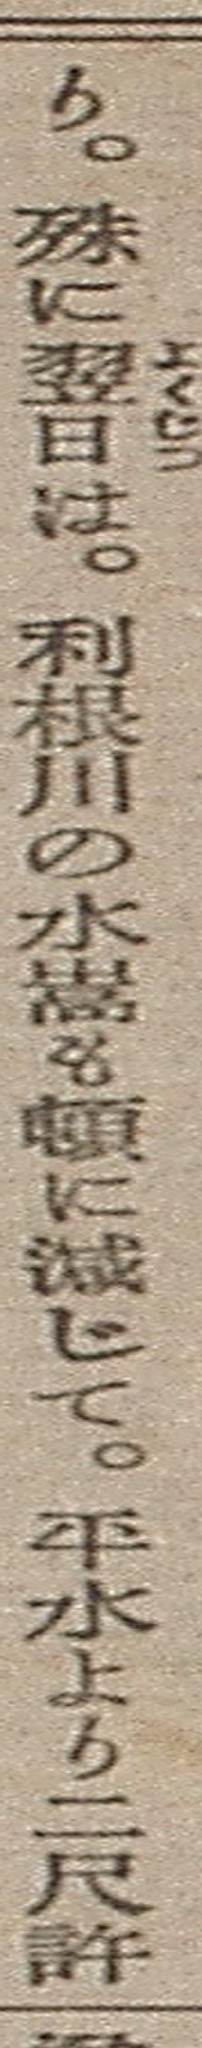り。殊に翌日は。利根川の水嵩も頓に減じて。平水より二尺許
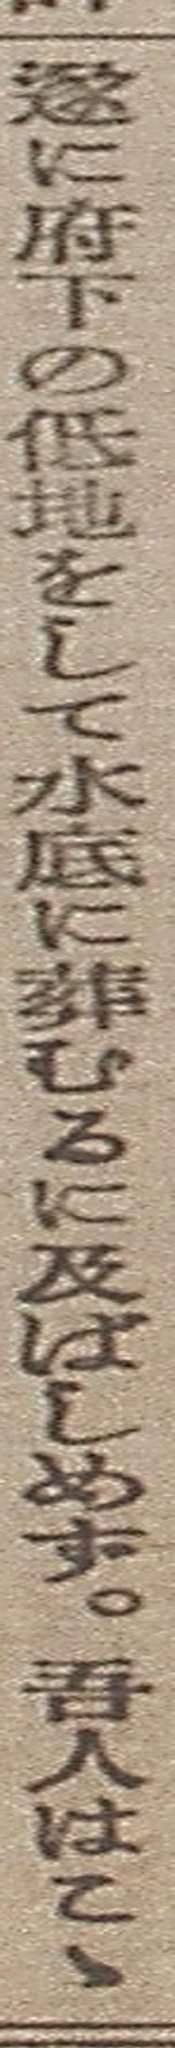遂に府下の低地をして水底に葬むるに及ばしめず。吾人はこゝ
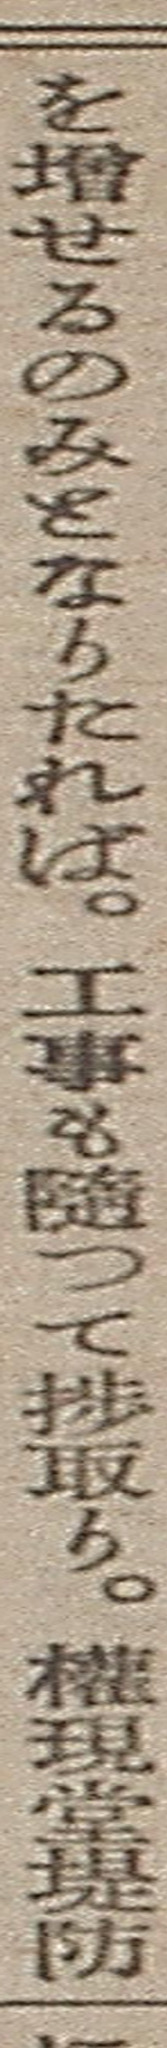を増せるのみとなりたれば。工事も随つて捗取り。権現堂堤防
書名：風俗畫報臨時増刊第百九十九號　明治三十二年十月各地災害圖會（前編之續）
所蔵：東京大学地震研究所図書室 Earthquake Research Institute Library, The University of Tokyo, JAPAN
